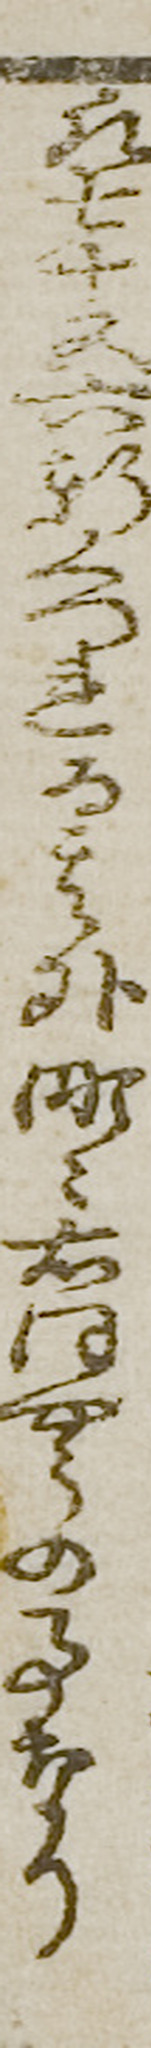凡七十五六軒くつれる其外町々右同やうの事なり
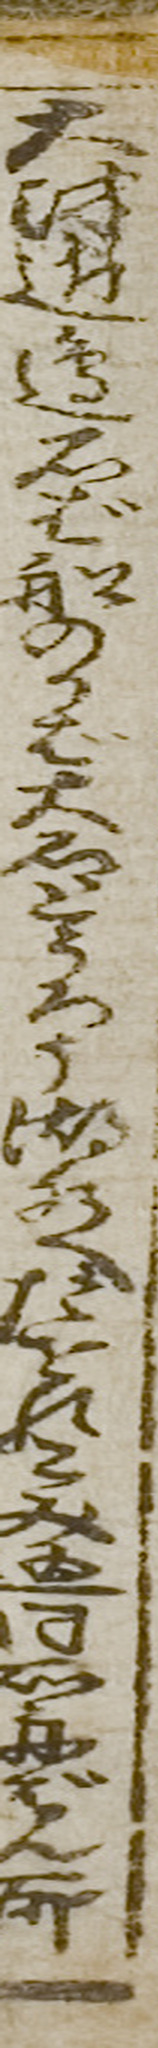大津近辺石ば船のりば大石とうろう湖水へたをれこみ込同所舟ばん所
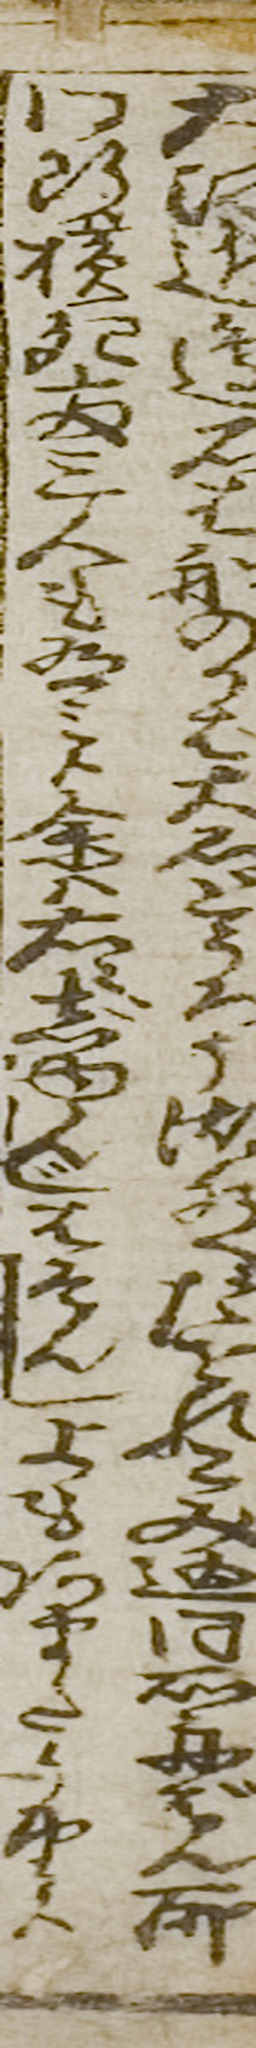同断横死三人も有三人余は右にじゆんじはそんしよもあまた御座候
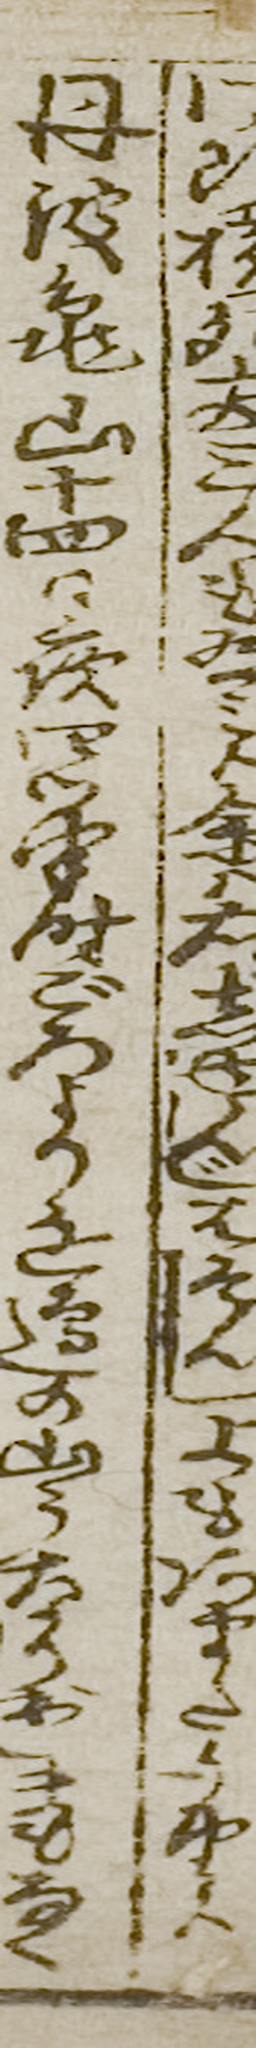丹波亀山十四日夜四ツ半時ごろより近辺の山うなり出しまもなく
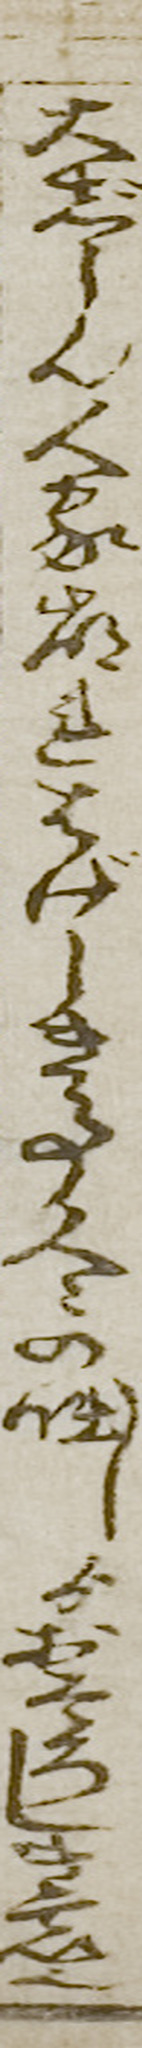大じしん人家崩れはげしき事人々の咄しよりおそろしきてい也
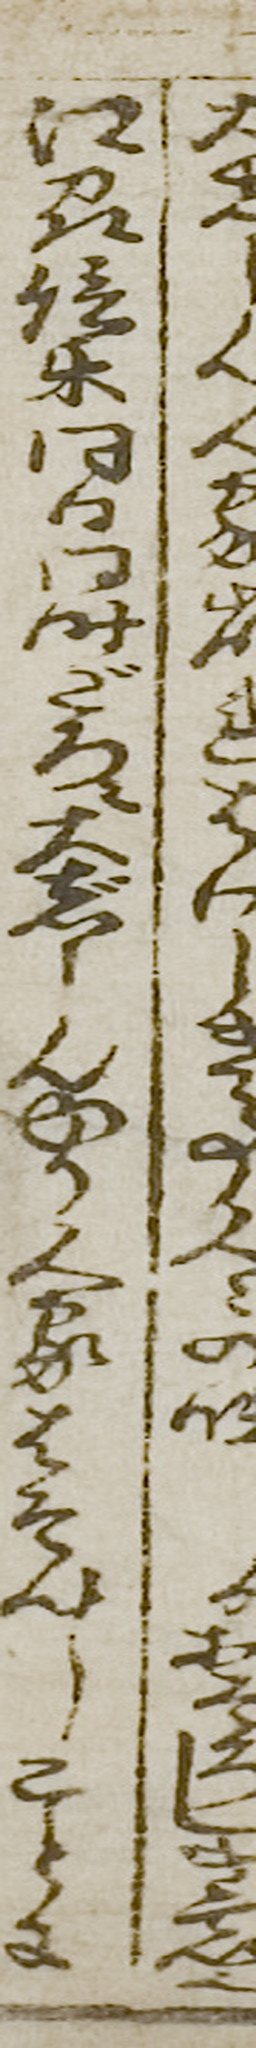江州信楽同日同時ごろに大じしんゆり人家はそんしことに
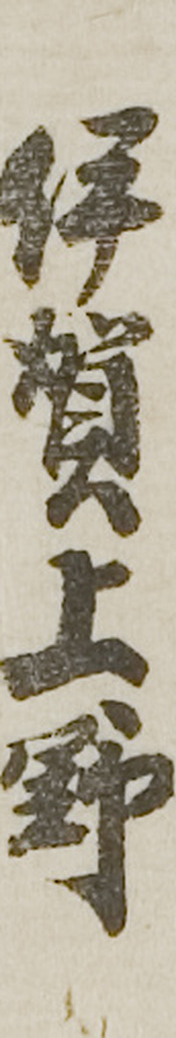伊賀上野
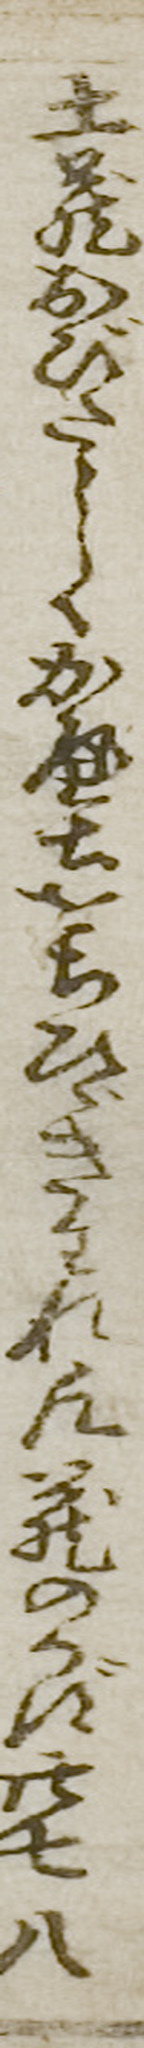土蔵おびたゝしくかへ土をちひゞきわれ凡蔵のかず廿七八
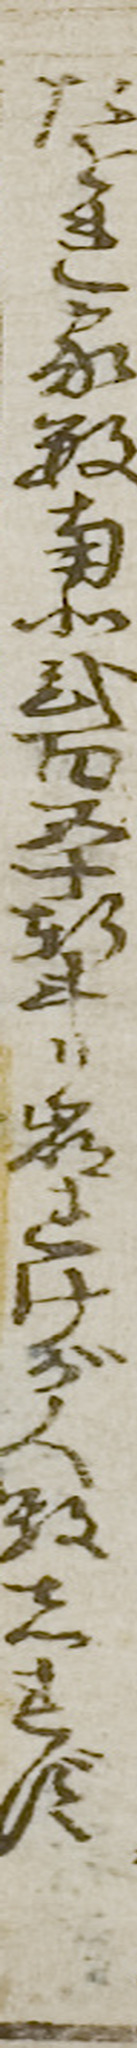たをれ家数南北弐百五十軒斗り崩れけが人数しれず
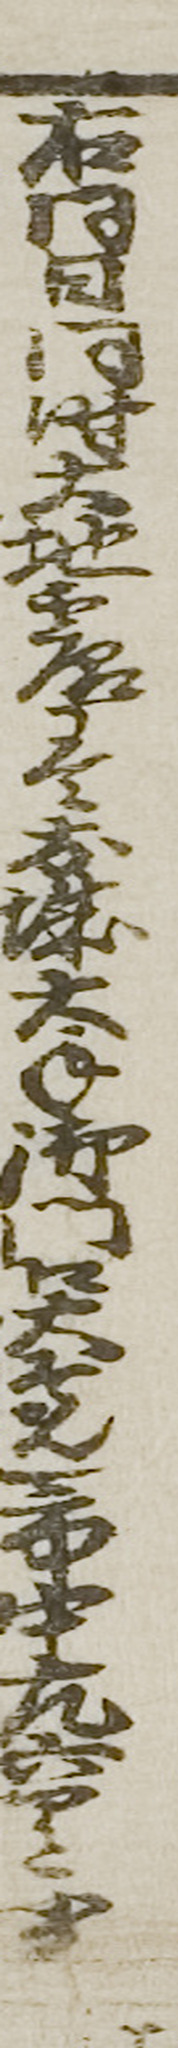右同日同時大地震にてお城大手御門口大そんし市中凡六部とふり
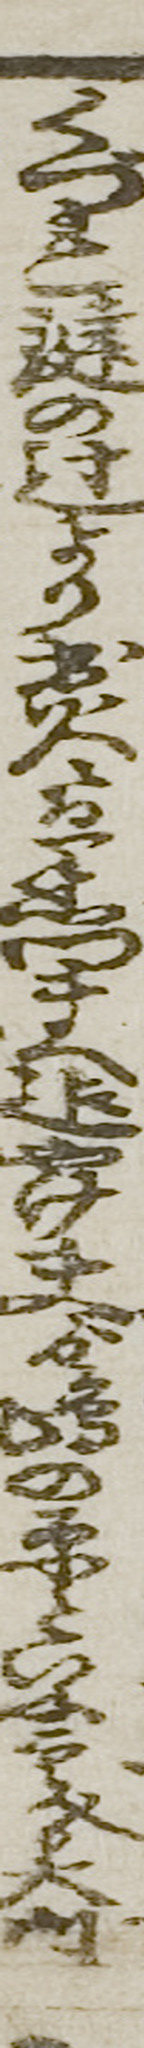くづれ鍵の辻より出火に而黒門まへ迄やけ夫より嶋の原といふ処より大川
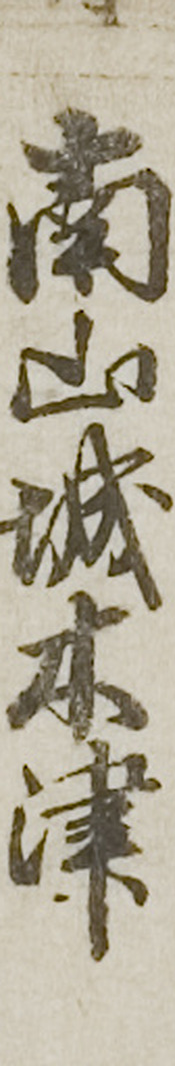南山城木津
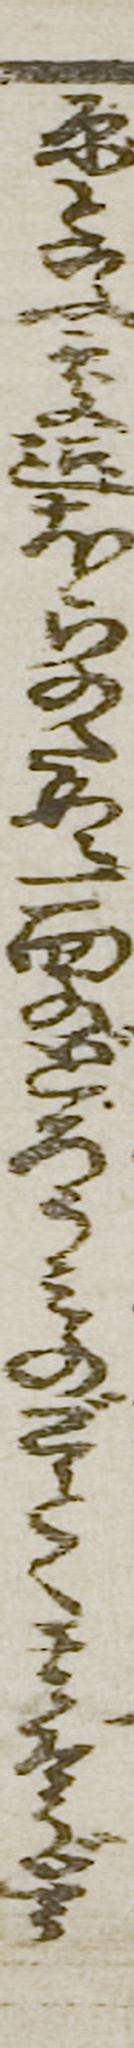原といふ処迄ほらのために一面のどろうみのごとく其所うづみ
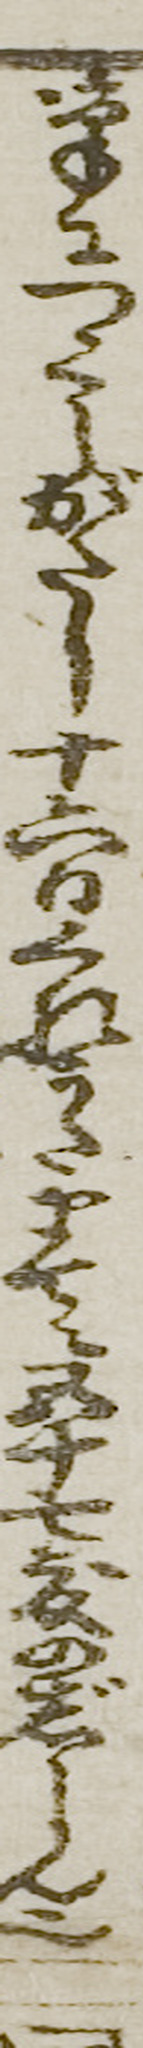筆につくしがたし十六日くれがたまてに五十七度のじしん也
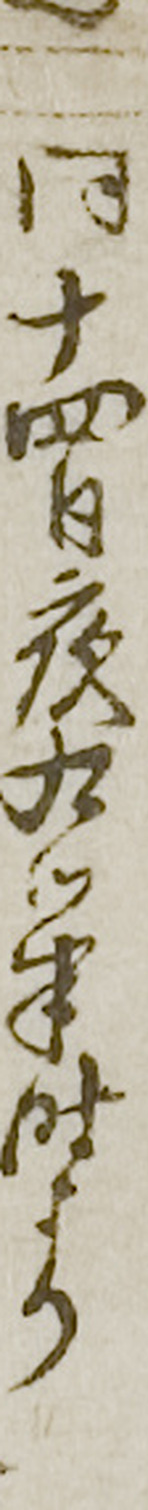同十四日夜九つ半時より
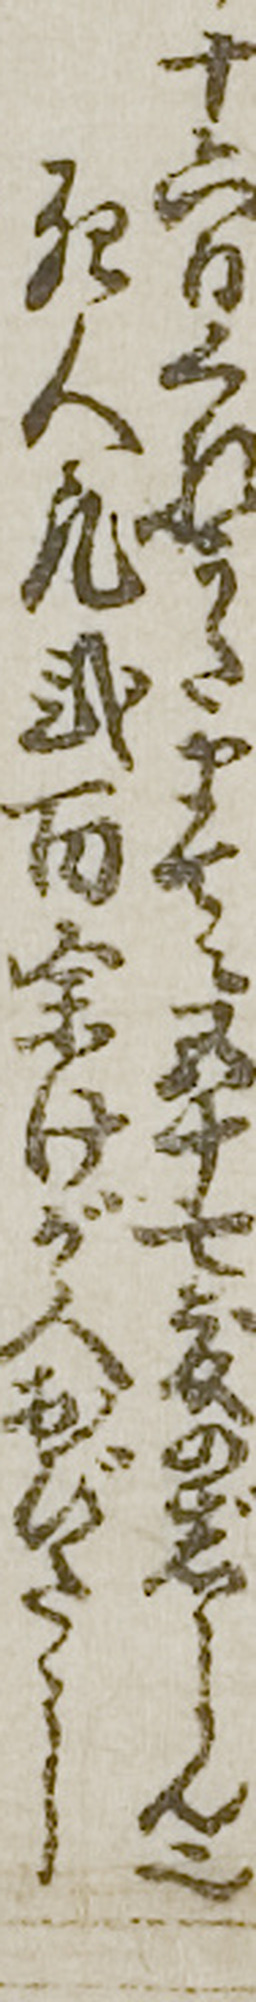死人凡弐百余けが人おびたゝし
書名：早飛脚廻りにてくわしき所本しらべ大地震
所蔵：東京大学総合図書館 General Library in the University of Tokyo, JAPAN
